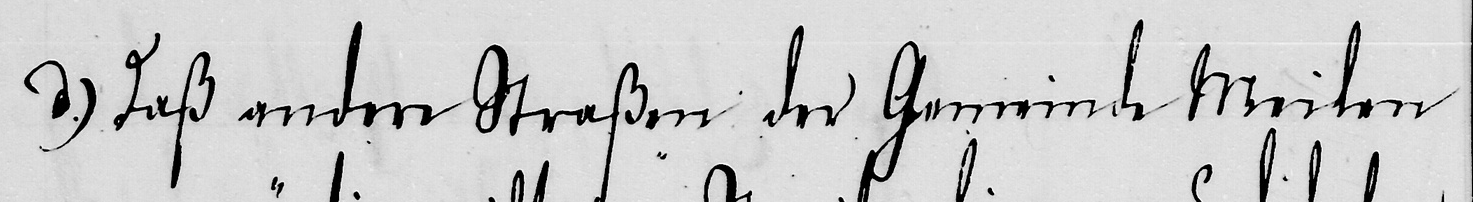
d.) Daß andere Straßen der Gemeinde Meilen
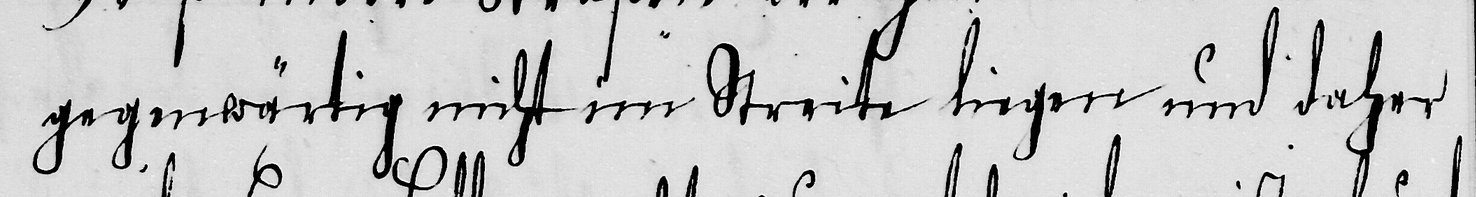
gegenwärtig nicht im Streite liegen und daher
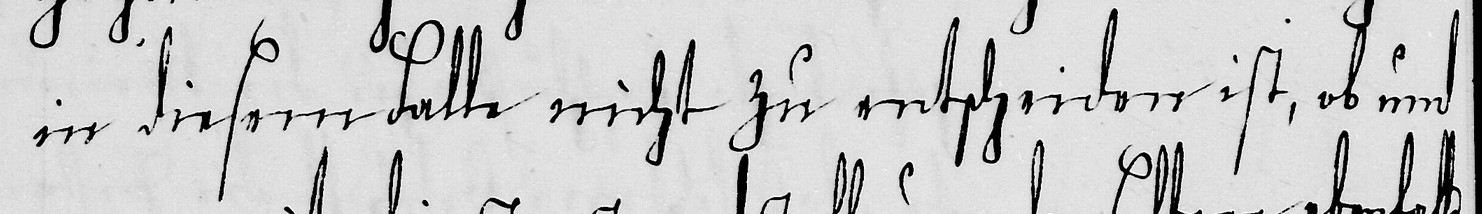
in diesem Falle nicht zu entscheiden ist, ob und
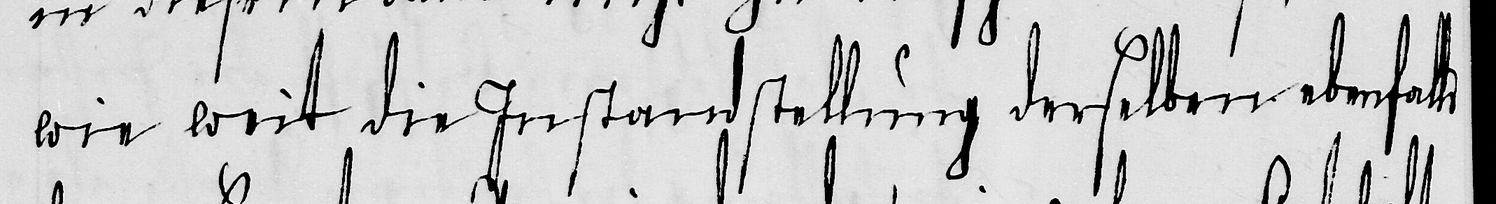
wie weit die Instandstellung derselben ebenfal¬
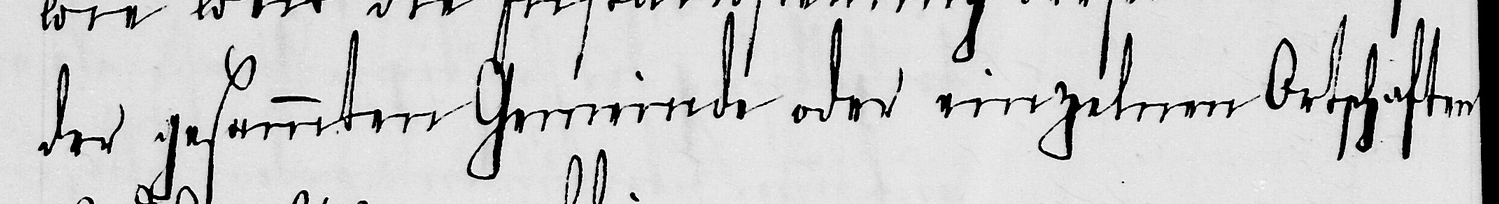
der gesammten Gemeinde oder einzelnen Ortschaften
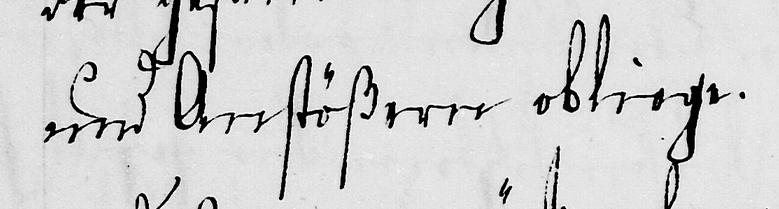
und Anstößern obliege.
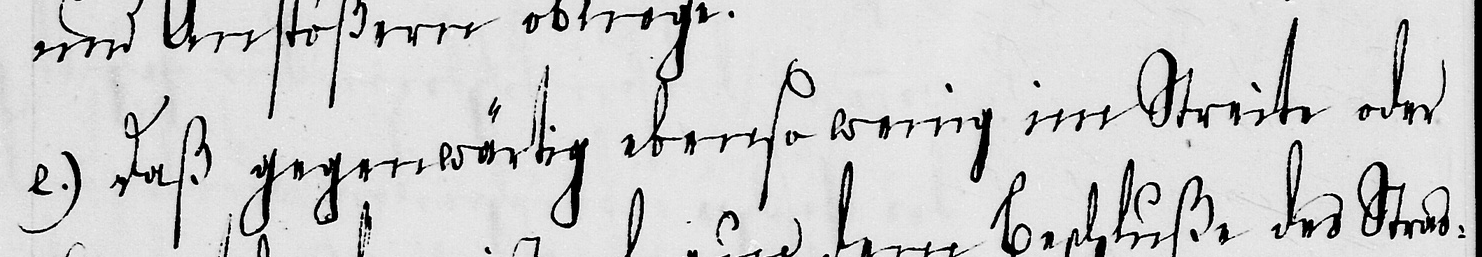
e.) Daß gegenwärtig ebenso wenig im Streite oder
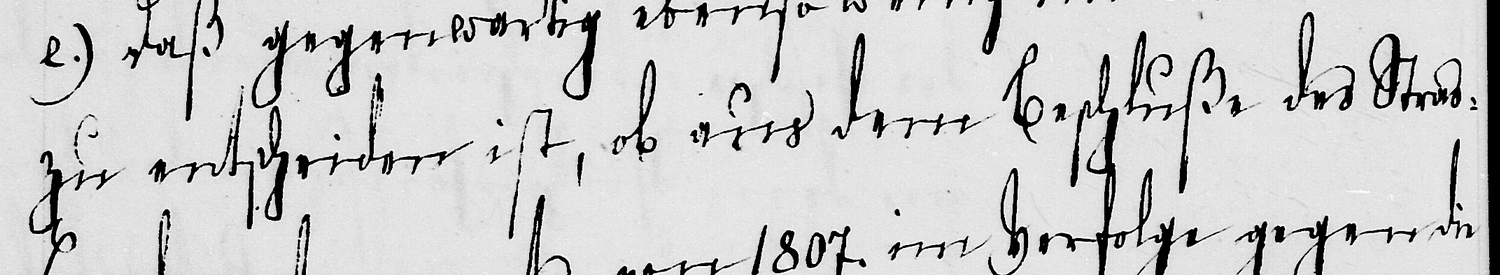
zu entscheiden ist, ob aus dem Beschluße des Straß¬
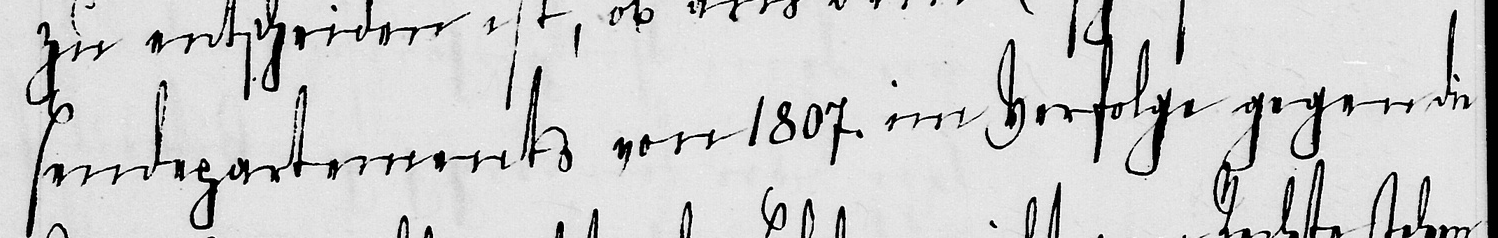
endepartements von 1807. im Verfolge gegen die
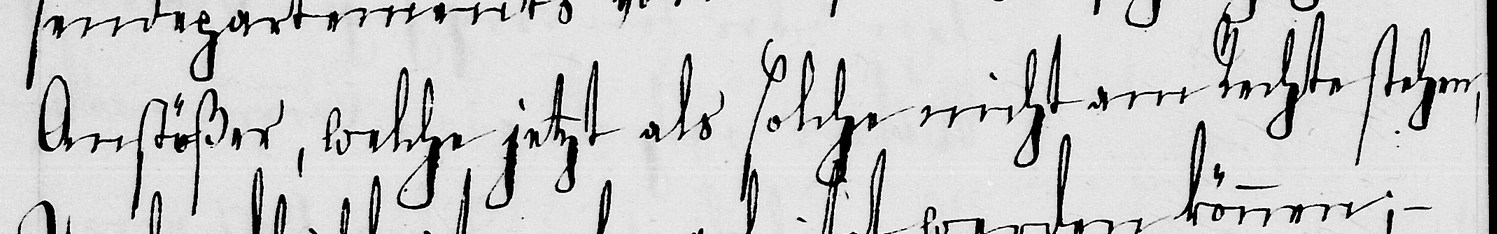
Anstößer, welche jetzt als solche nicht am Rechte steh¬
